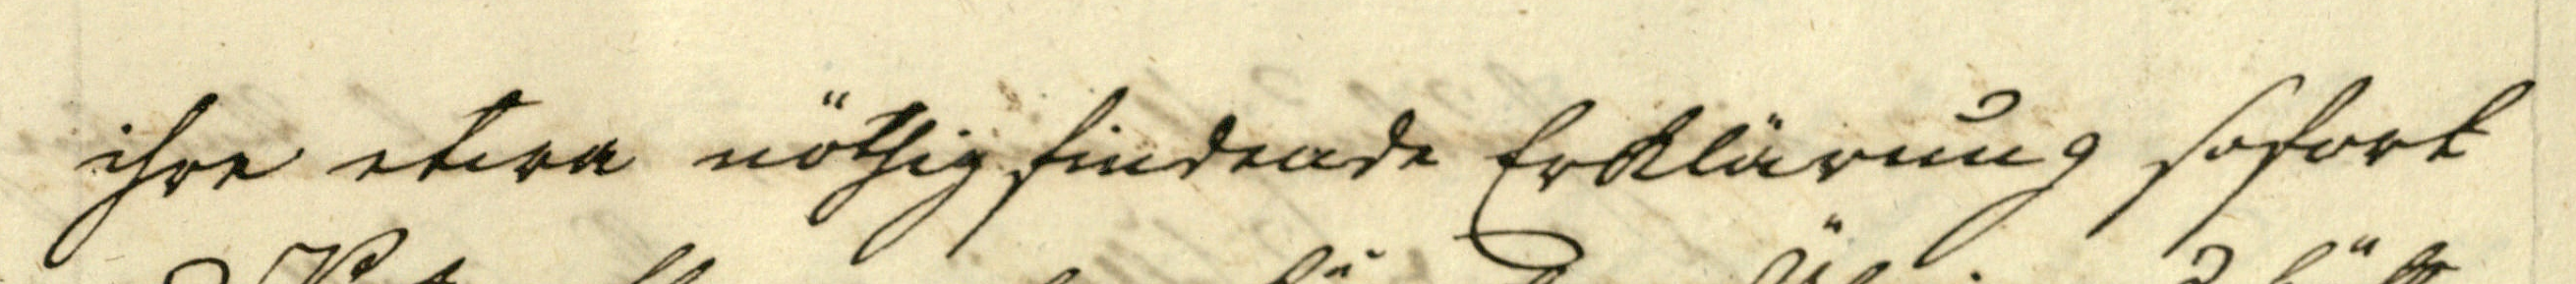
ihre etwa nöthig findende Erklärung sofort
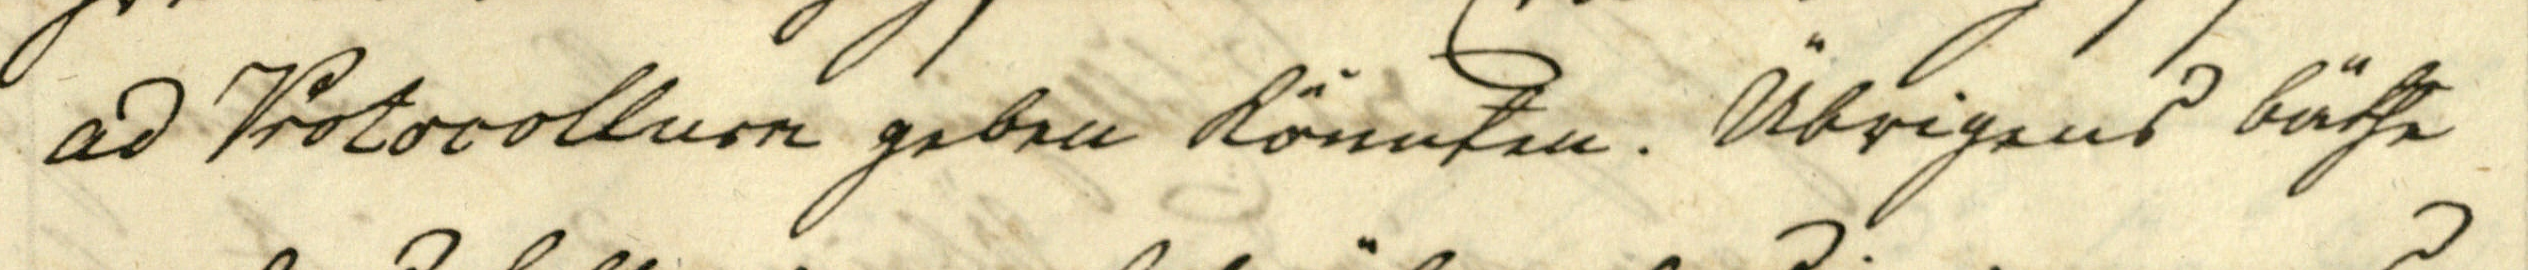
ad Protocollum geben könnten. Übrigens bäthe
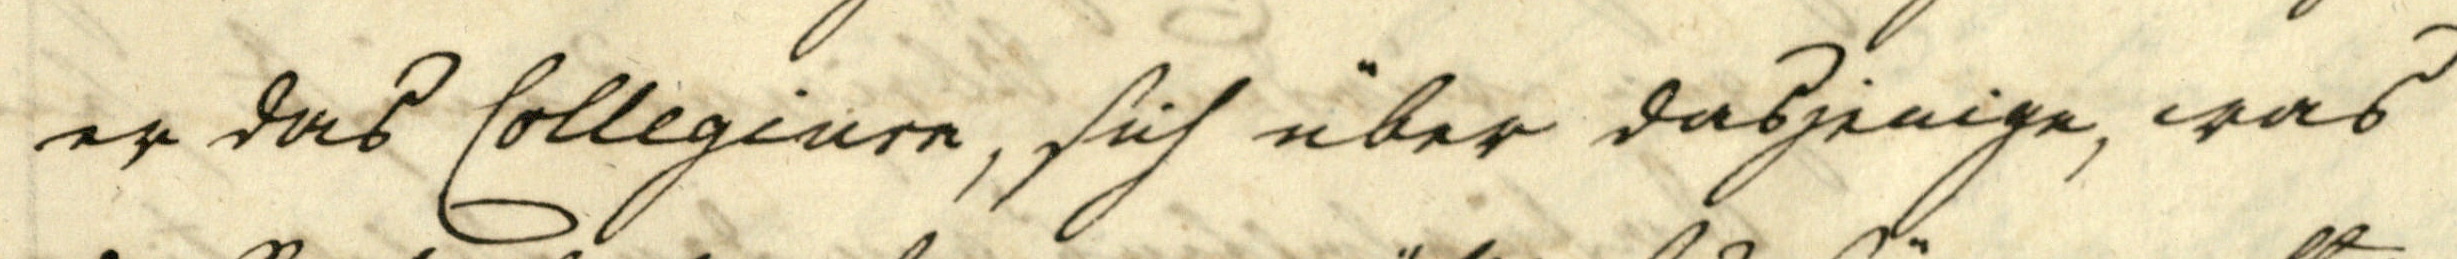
er das Collegium, sich über dasjenige, was
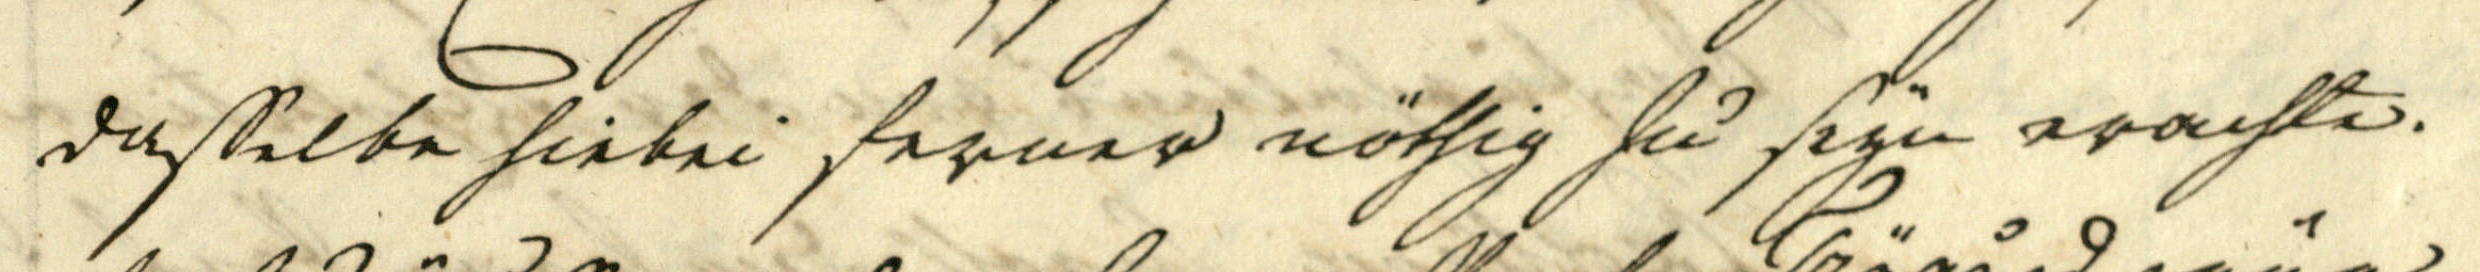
dasselbe hiebei ferner nöthig zu seÿn erachte¬
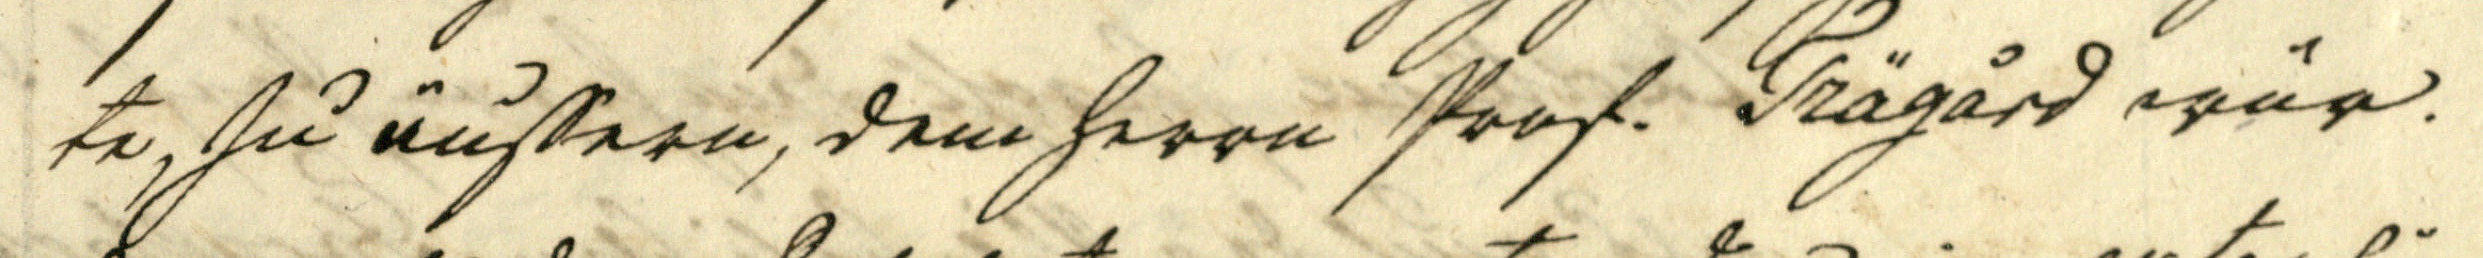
te zu äussern, dem Herrn Prof. Trägård wür¬
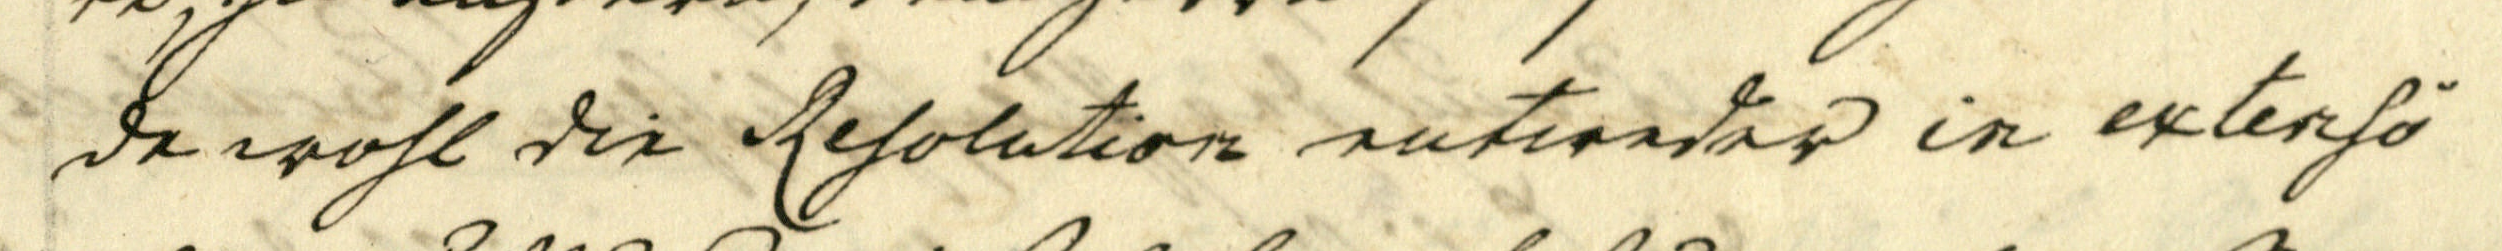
de wohl die Resolution entweder in extenso
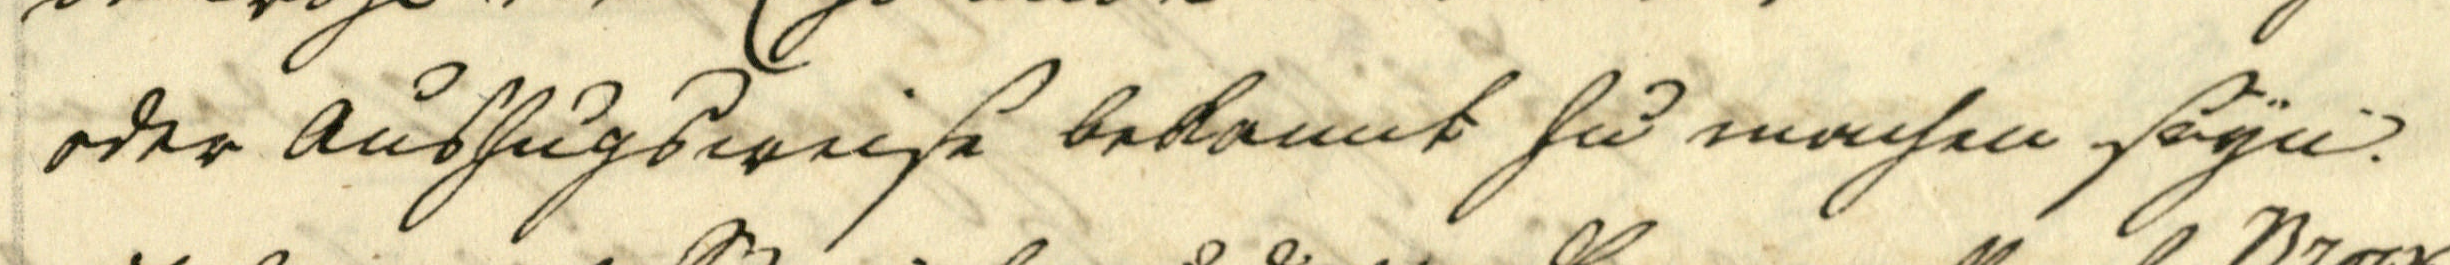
oder auszugsweise bekannt zu machen seÿn.
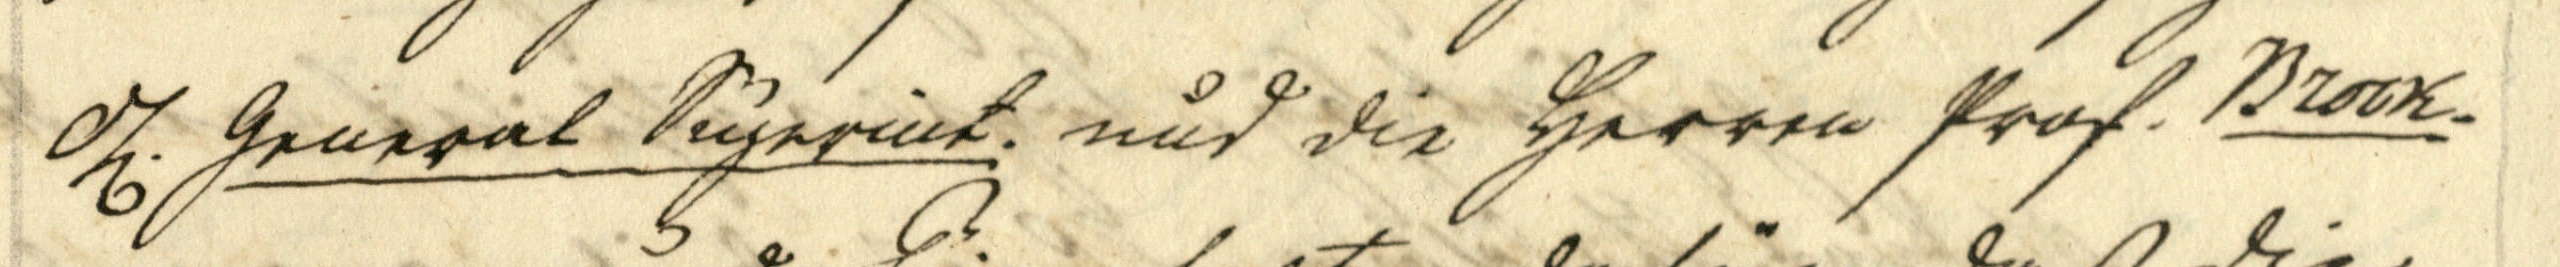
dh. General. Superint. und die Herren Prof. Brock¬
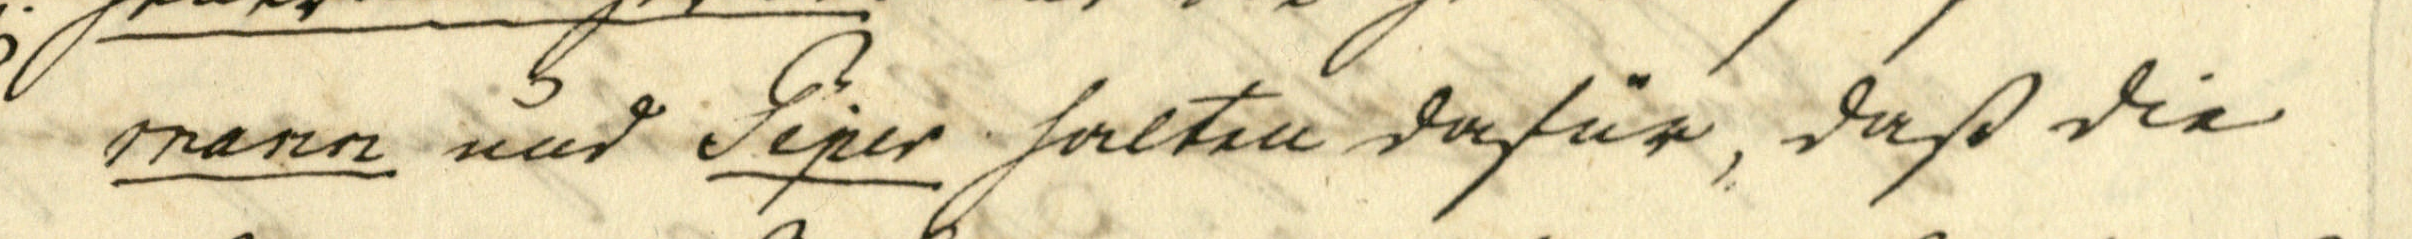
mann und Piper halten dafür, daß die
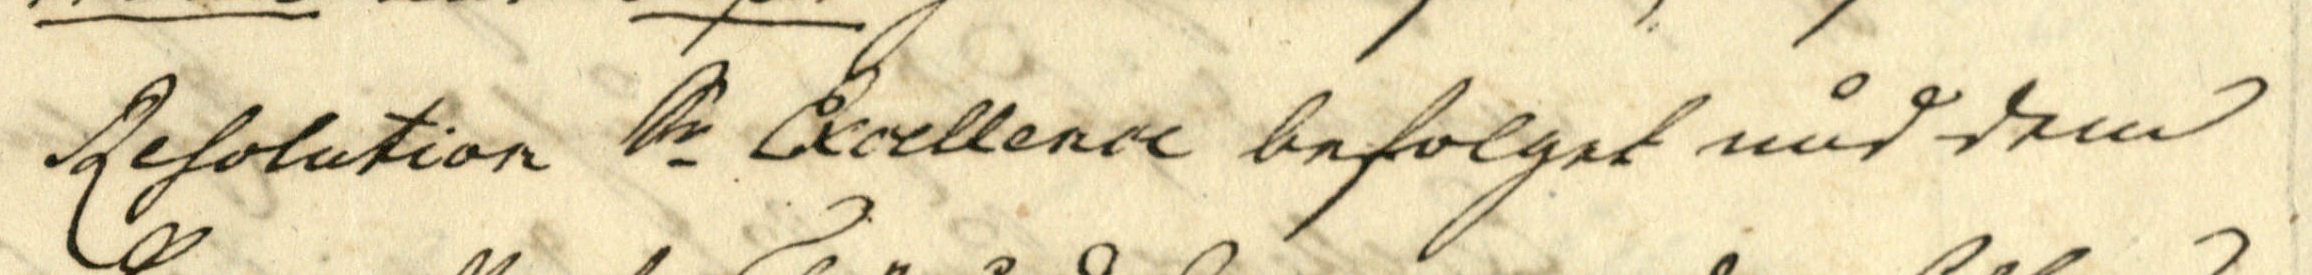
Resolution Sr Excellence befolget und dem
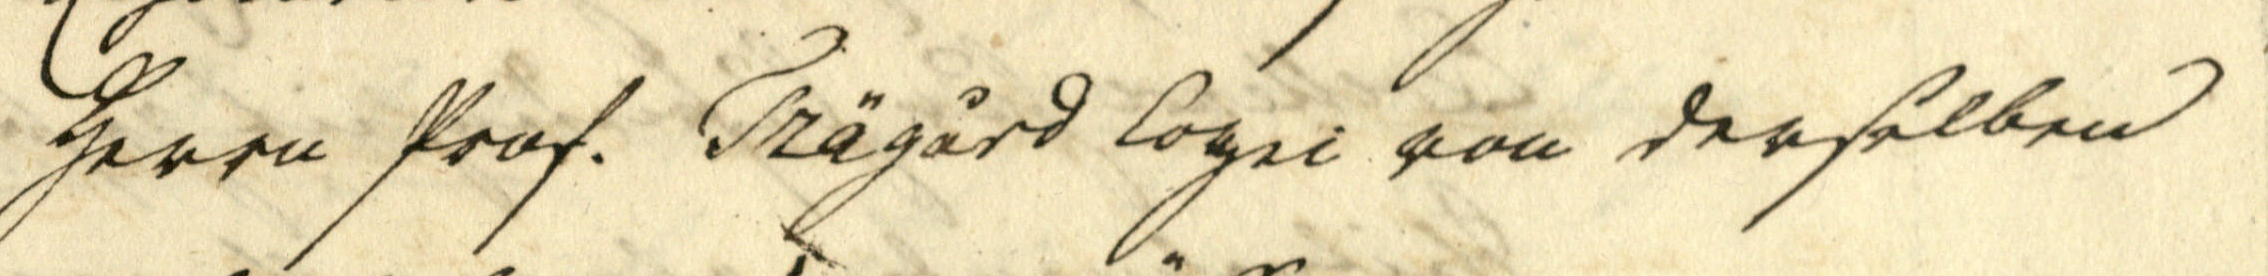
Herrn Prof. Trägård Copei von derselben
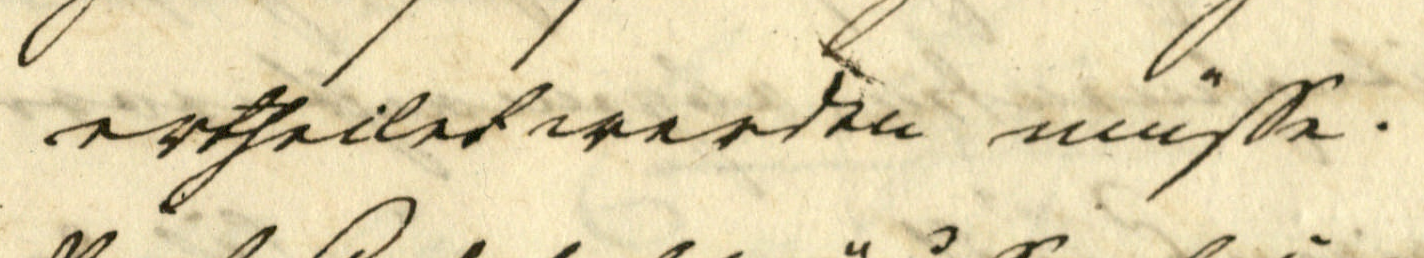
ertheilet werden müsse.
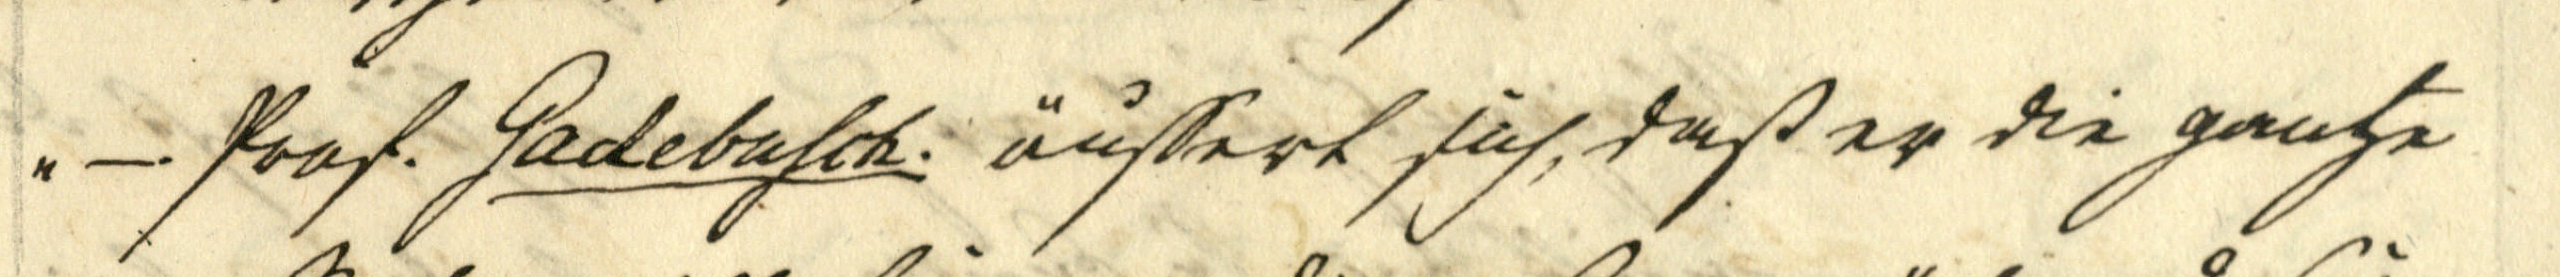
Prof. Gadebusch äussert sich, daß er die gantze
